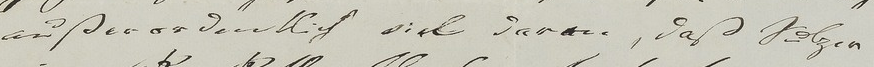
außerordentlich viel daran, daß Sulzer
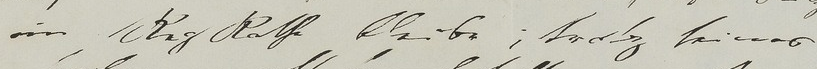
im RegRath bleibe; trotz seines
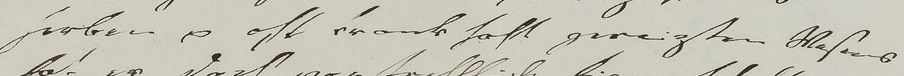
herben & oft krankhaft gereizten Wesens
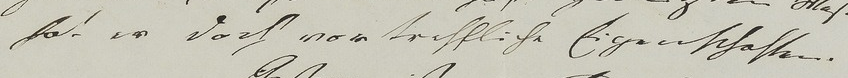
hat er doch vortreffliche Eigenschaften.
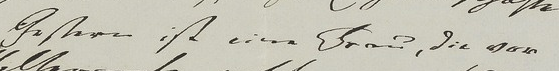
Gestern ist eine Frau, die vor
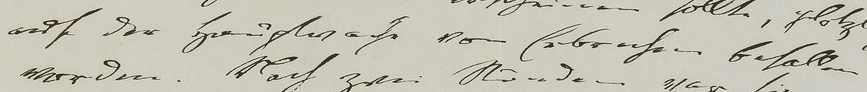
auf der Hauptwache von Erbrechen befallen
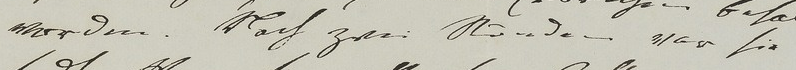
worden. Nach zwei Stunden war sie
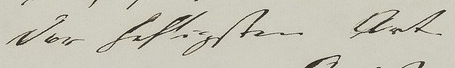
der heftigsten Art.
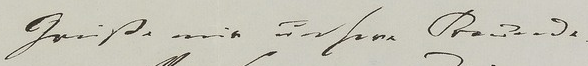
Grüße mir unsere Freunde.
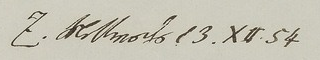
Z. Mittwochs 13.XII.54
